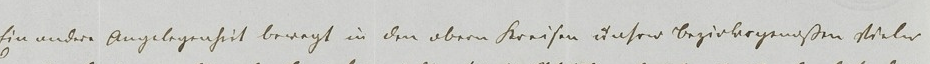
Ein andere Angelegenheit bewegt in den obern Kreisen unsrer Bezirksgenossen Vieler
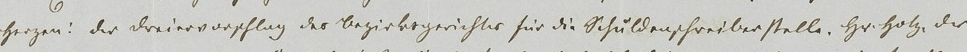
Herzen: der Dreiervorschlag des Bezirksgerichtes für die Schuldenschreiberstelle. Hr. Hotz, der
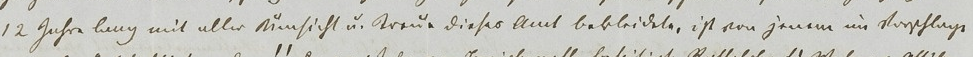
12 Jahre lang mit aller Umsicht u. Treue dieses Amt bekleidete, ist von jenem im Vorschlage
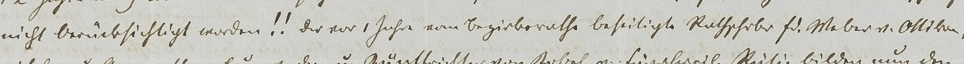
nicht berücksichtigt worden!! Der vor 1 Jahre vom Bezirksrathe beseitigte Rathschrbr Fd. Weber v. Ottikon,
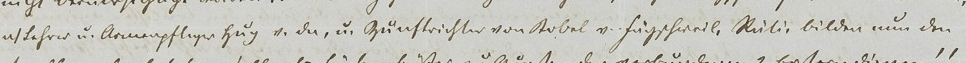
alt Lehrer u. Armenpfleger Hug v. da, u. Zunftrichter von Tobel v. Fägschweil, Rüti, bilden nun den
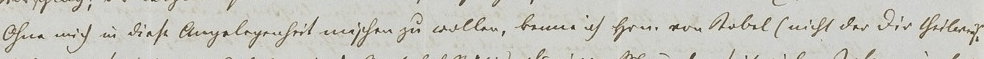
Ohne mich in diese Angelegenheit mischen zu wollen, kenne ich Hrn. von Tobel (nicht der Dir theilweise
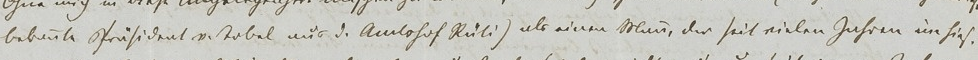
bekannte Präsident v. Tobel aus d. Amtshof Rüti) als einen Mann, der seit vielen Jahren im hies.
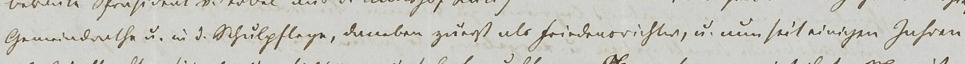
Gemeindrathe u. in d. Schulpflege, daneben zuerst als Friedensrichter, u. nun seit einigen Jahren
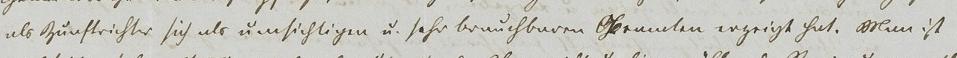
als Zunftrichter sich als umsichtigen u. sehr brauchbaren Beamten erzeigt hat. Man ist
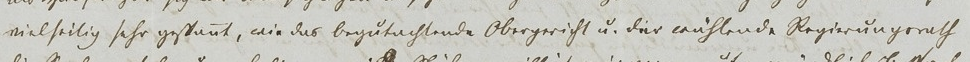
vielfältig sehr gespannt, wie das begutachtende Obergericht u. der wählende Regierungsrath
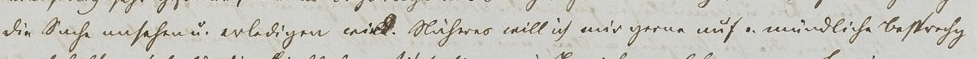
die Sache ansehen u. erledigen wird. Näheres will ich mir gerne auf e. mündliche Besprechg
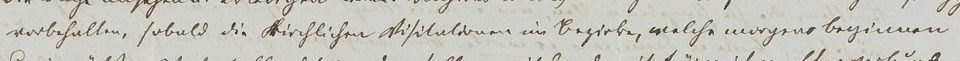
vorbehalten, sobald die kirchlichen Visitationen im Bezirke, welche morgen beginnen
